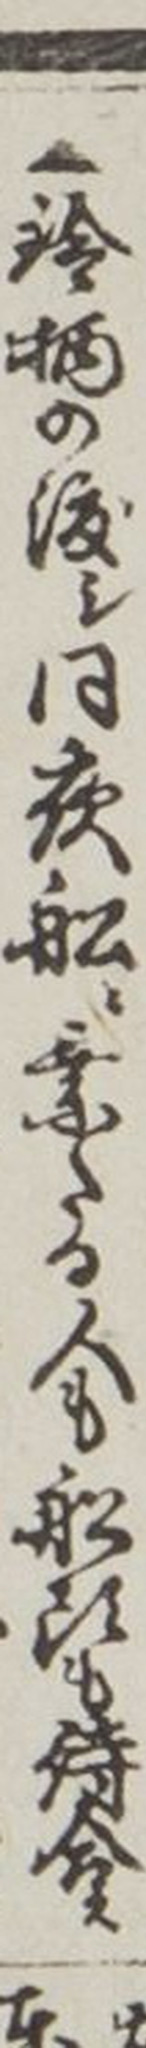▲鈴柄の渡し同夜船に乗たる人も船頭も待合す
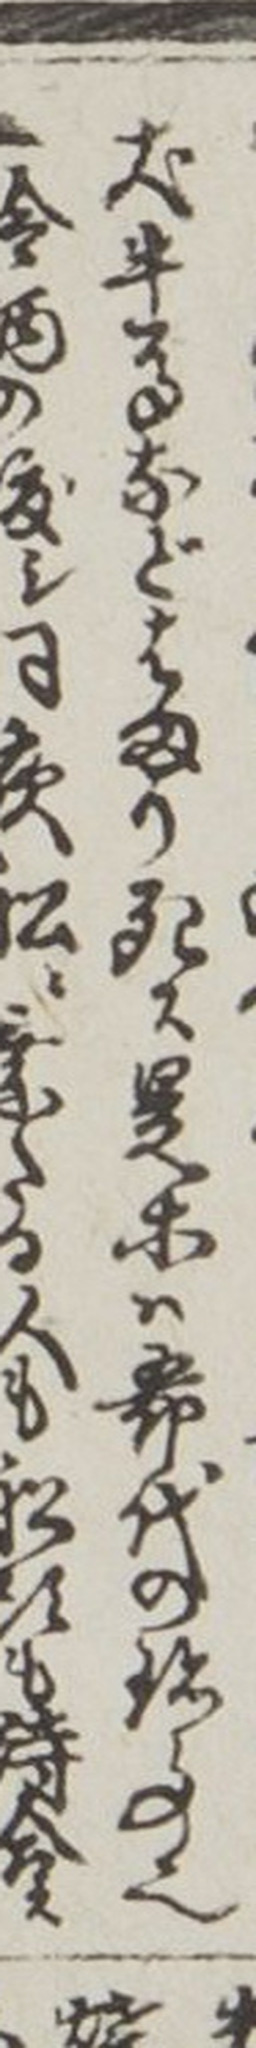▲鈴柄の渡し同夜船に乗たる人も船頭も待合す
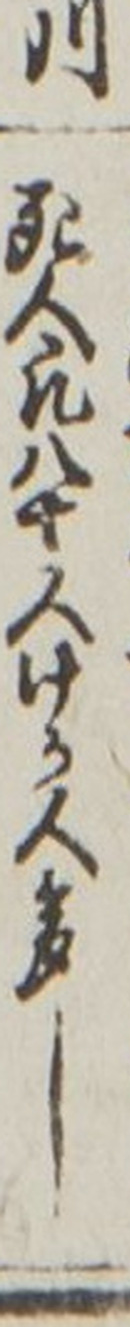死人凡八十人けか人多し
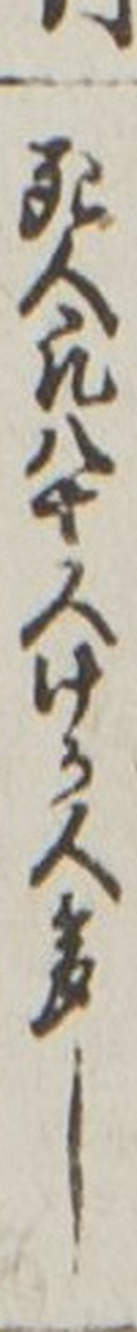死人凡八十人けか人多し
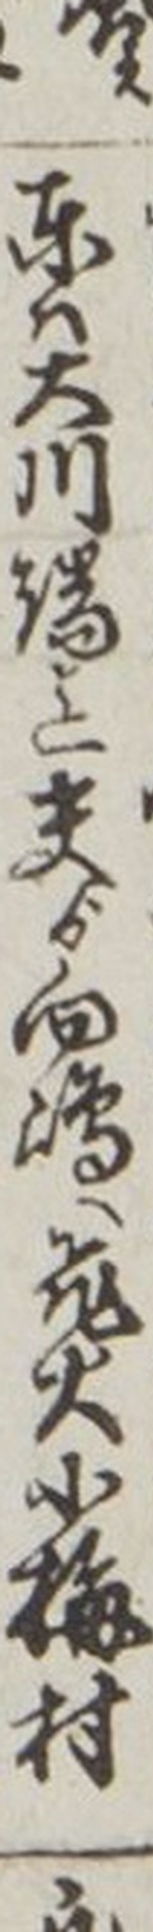東は大川端迄夫より向島へ飛火小梅村
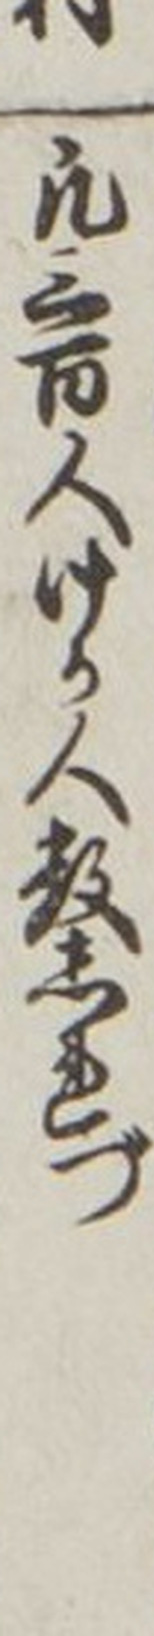凡三百人けか人数しれづ
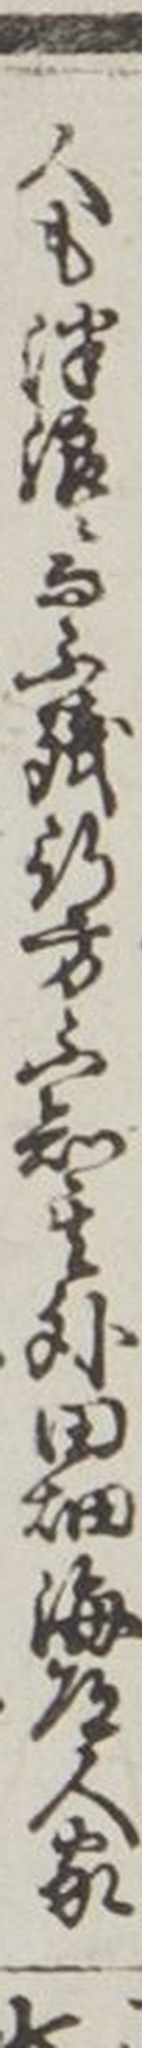人も津浪にて不残行方不知其外田畑海道人家
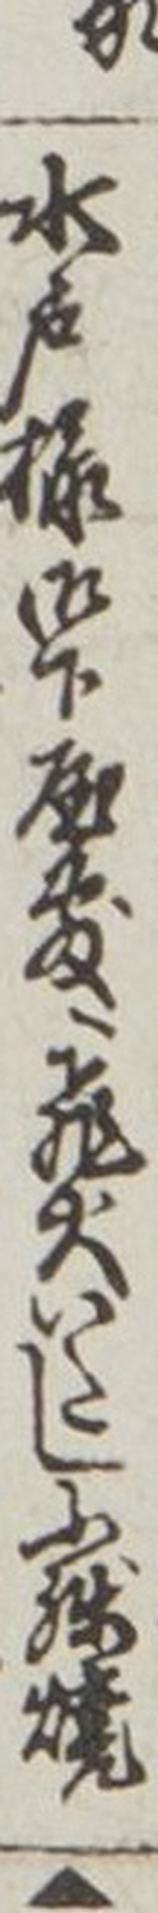水戸様御下屋敷へ飛火いたし不残焼
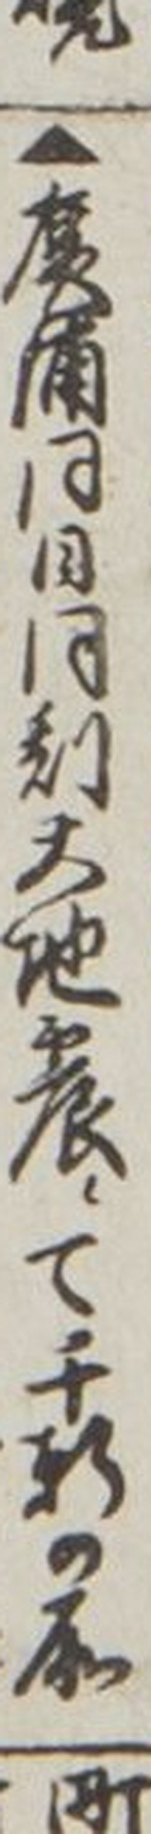▲広浦同日同刻大地震にて千軒の所
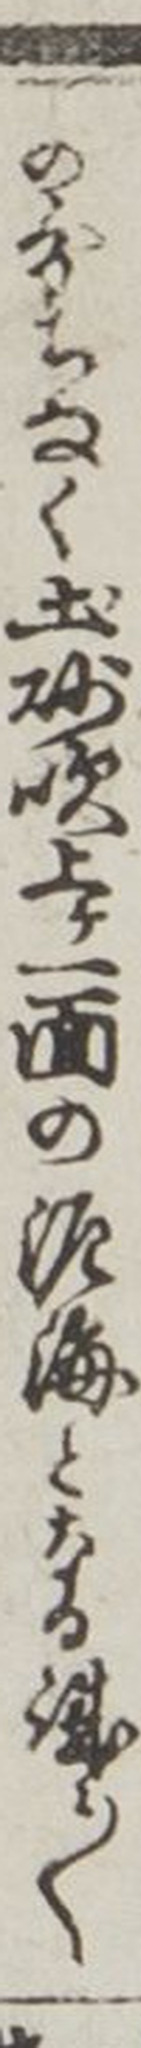の分ちなく土砂吹上け一面の泥海となる誠に〳〵
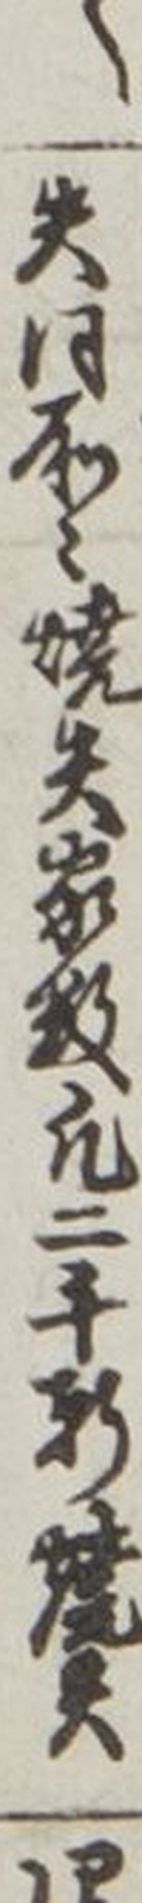失同所々焼失家数凡二千軒焼失
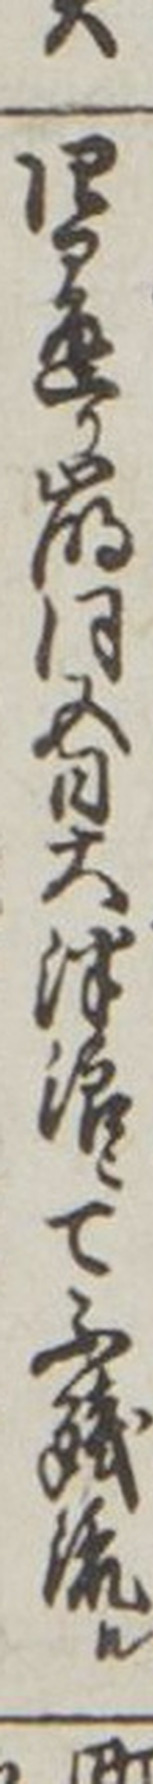四部通り崩同五日大津浪にて不残流る
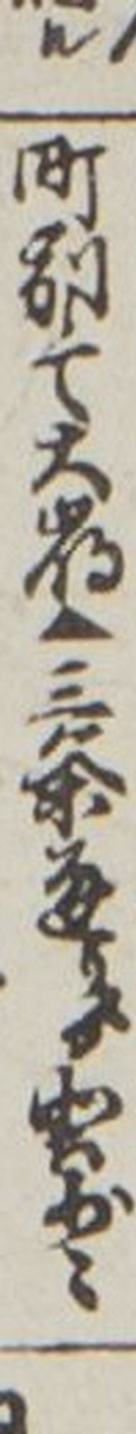町別して大崩▲三条通より北は少々
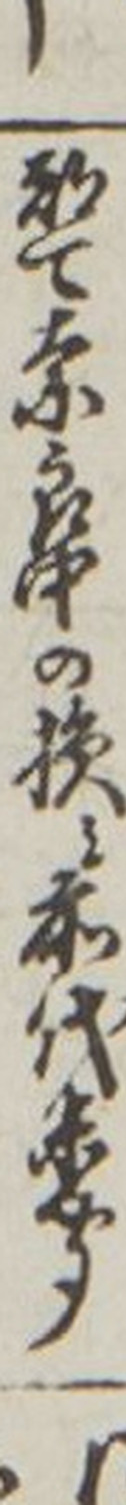都て奈良中の損し前代未聞
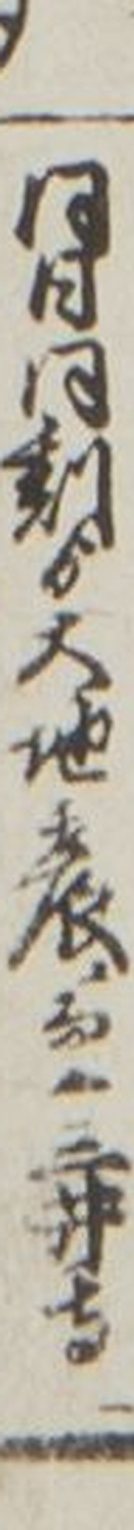同日同刻より大地震にて▲三井寺
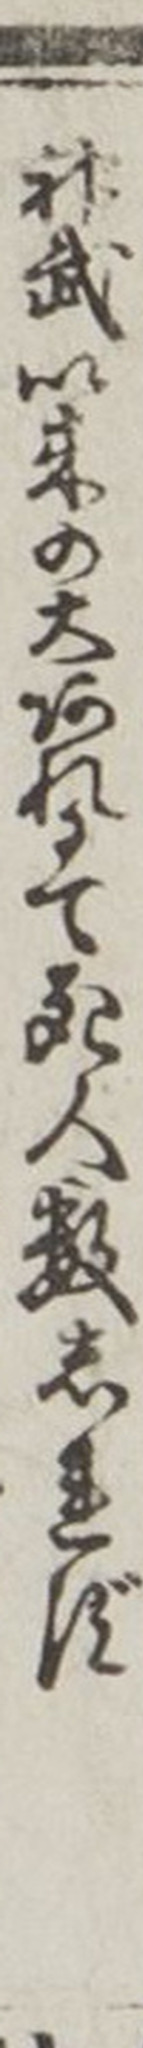神武以来の大あれにて死人数しれず
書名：嘉永七年寅十一月諸国大地震大津波并出火
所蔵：あいおいニッセイ同和損保株式会社
